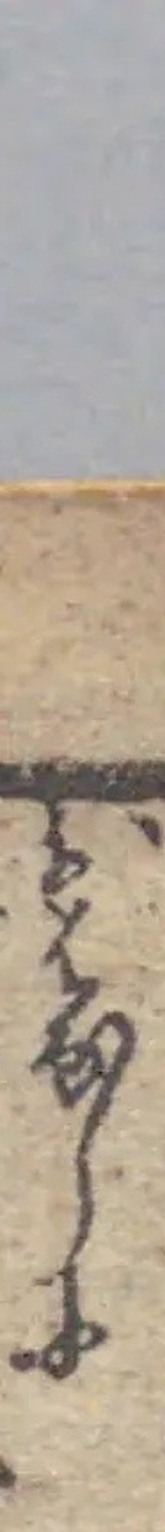おはなしに
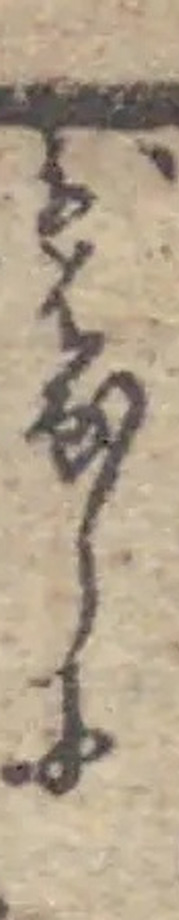おはなしに
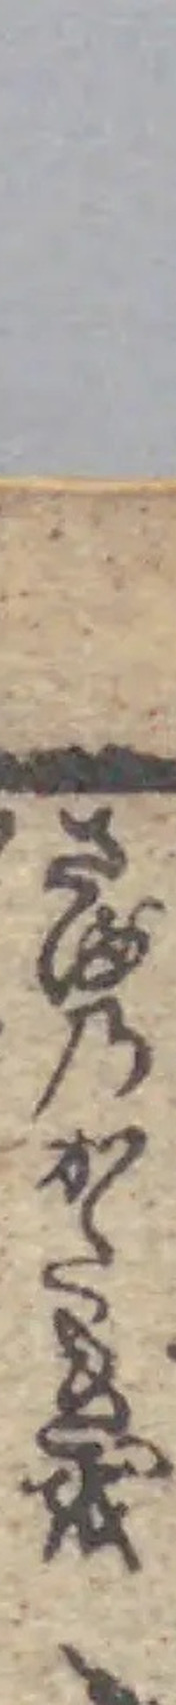さるのかたきを
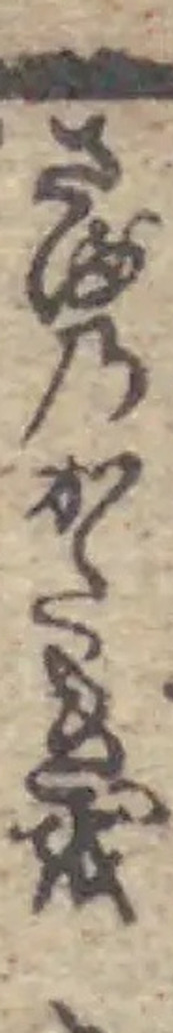さるのかたきを
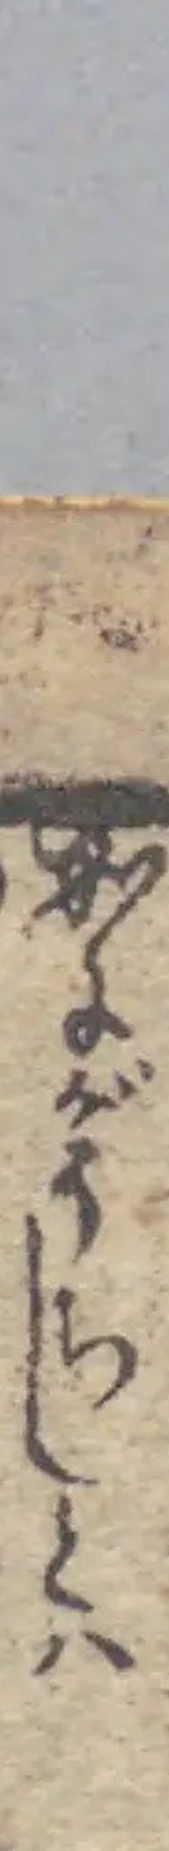かにがうちしとは
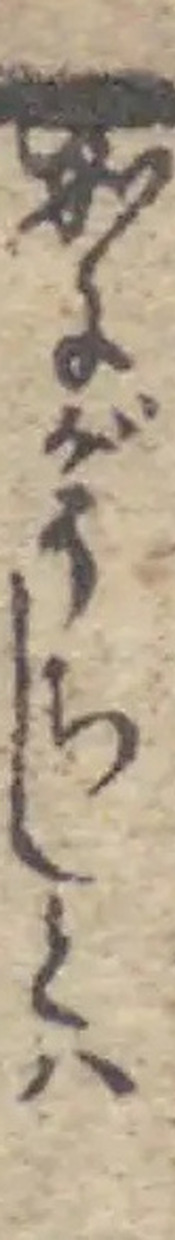かにがうちしとは
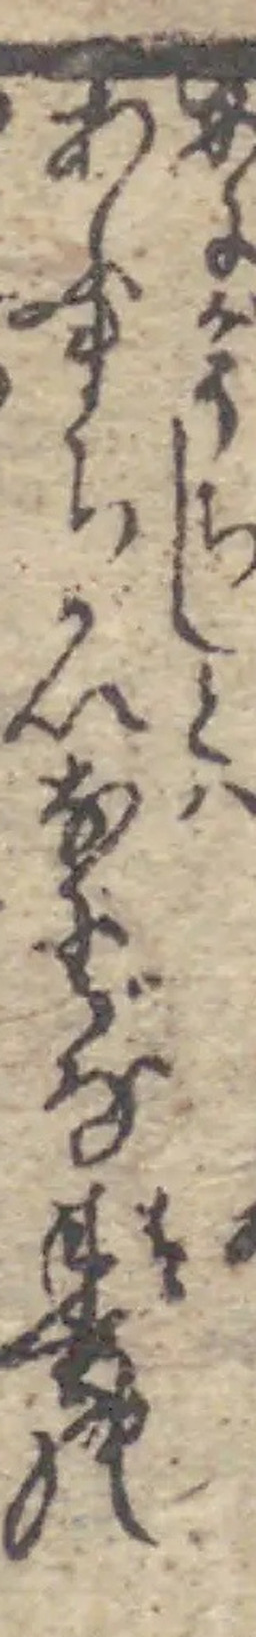あふまちがいなにがな春の
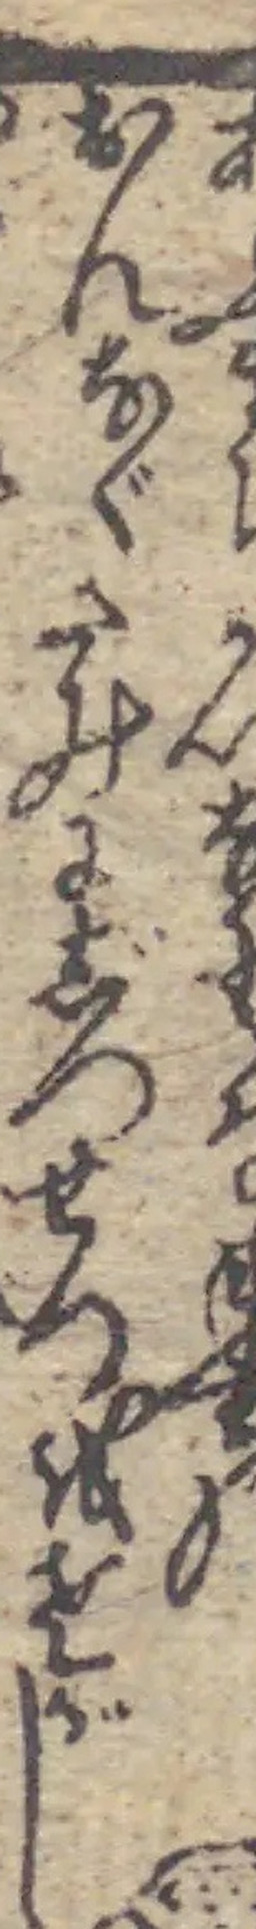おんなぐさみにじつせつをさがし
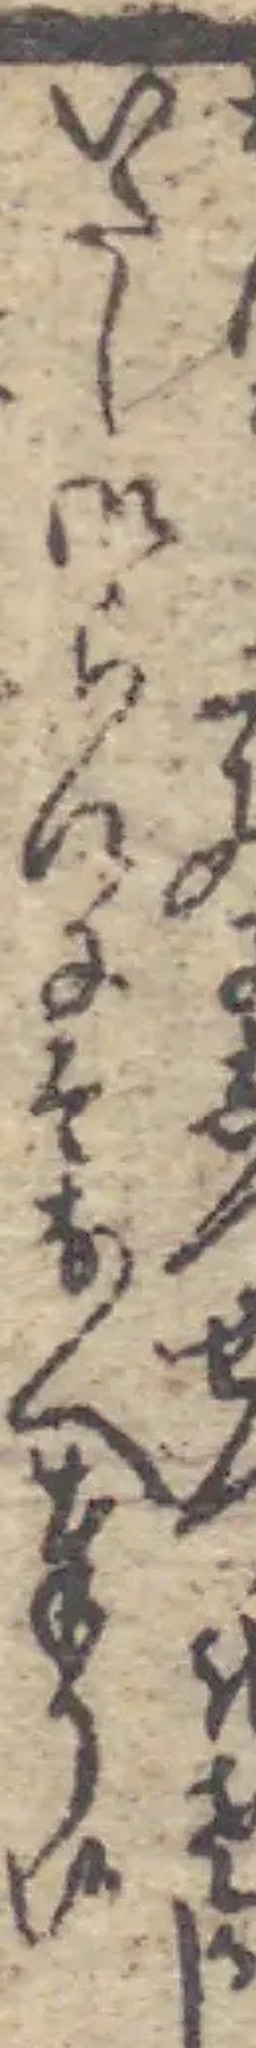いたし御らんにそなへ奉り候
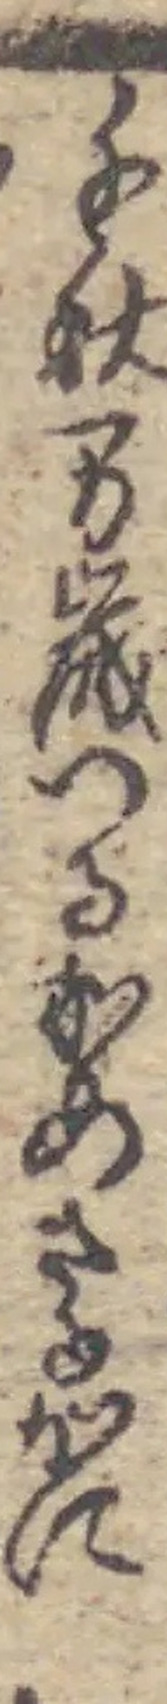千秋万歳つるかめさるかに
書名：蟹牛房挟多 3巻
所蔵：国立国会図書館 National Diet Library, JAPAN
